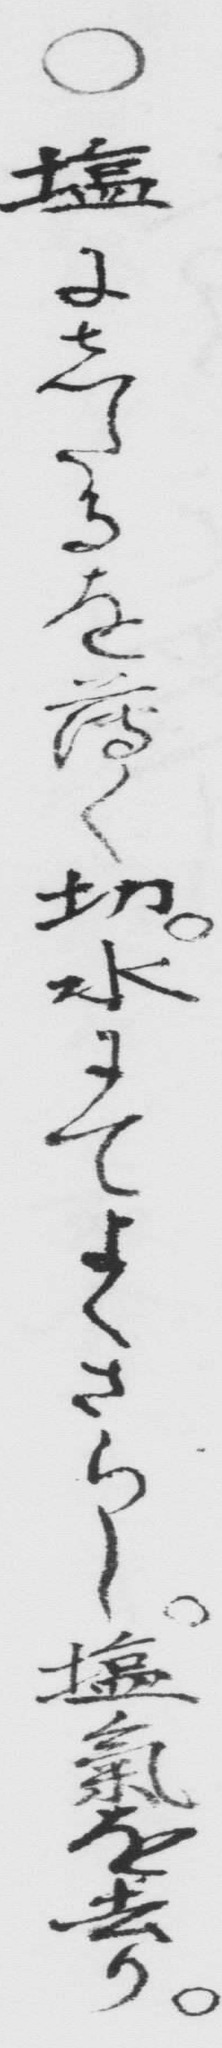○塩にしたるを薄く切。水にてよくさらし。塩気を去り。
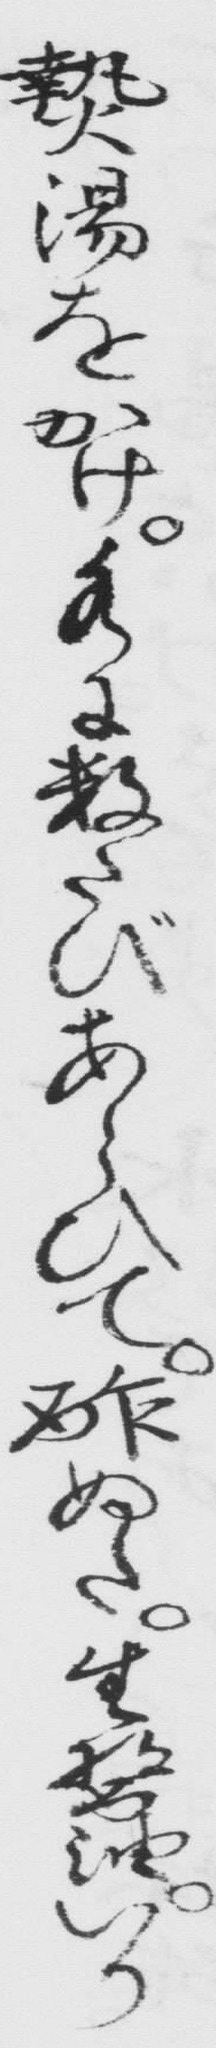熱湯をかけ。水に数たびあらひて。酢ぬた。生醤油。いり
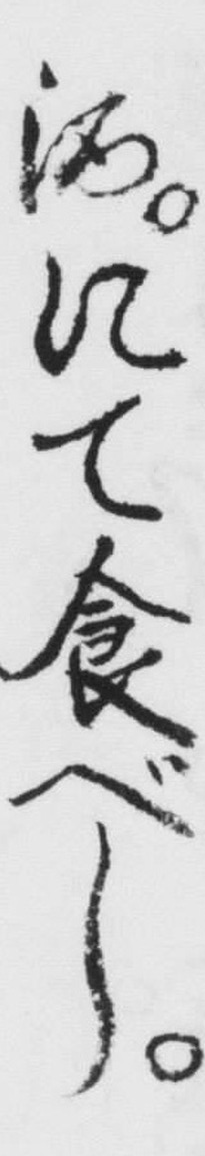酒にて食べし。
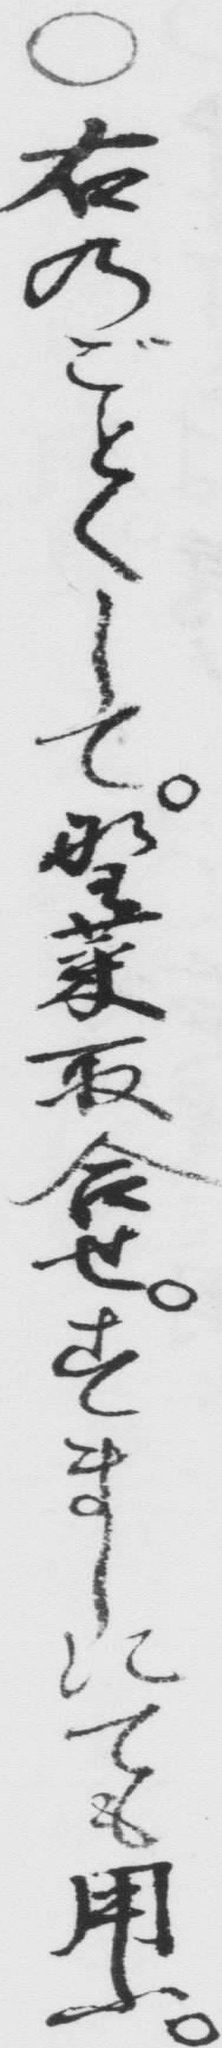○右のごとくして。野菜取合せ。すましにても用ふ。
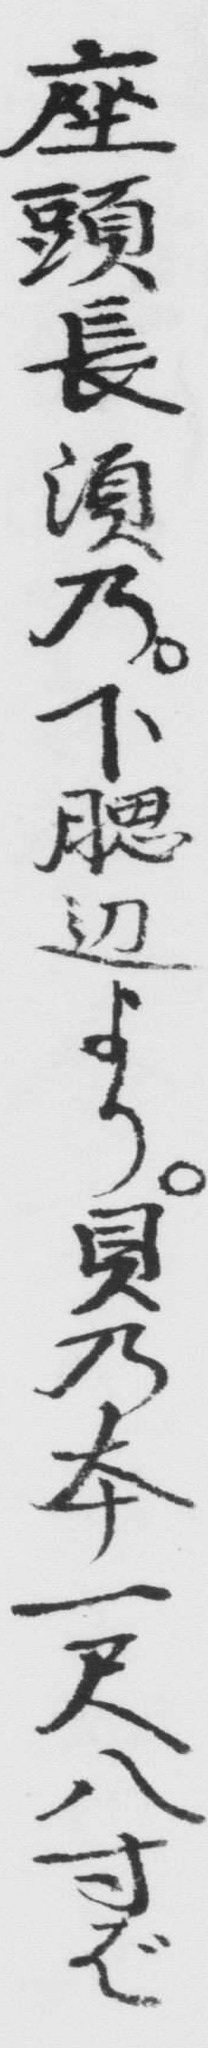簀子座頭長須の。下腮辺より。貝の本一尺八寸ば
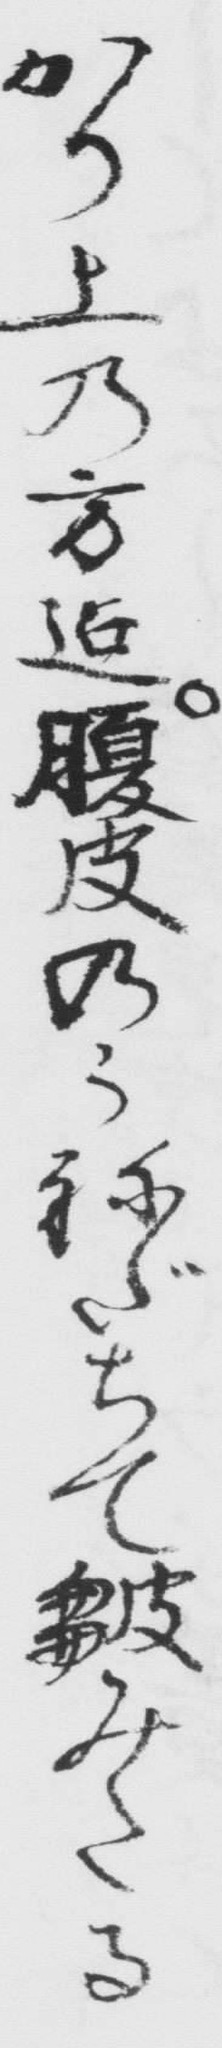かり上の方迄。腹皮のうねだちて皺みたる
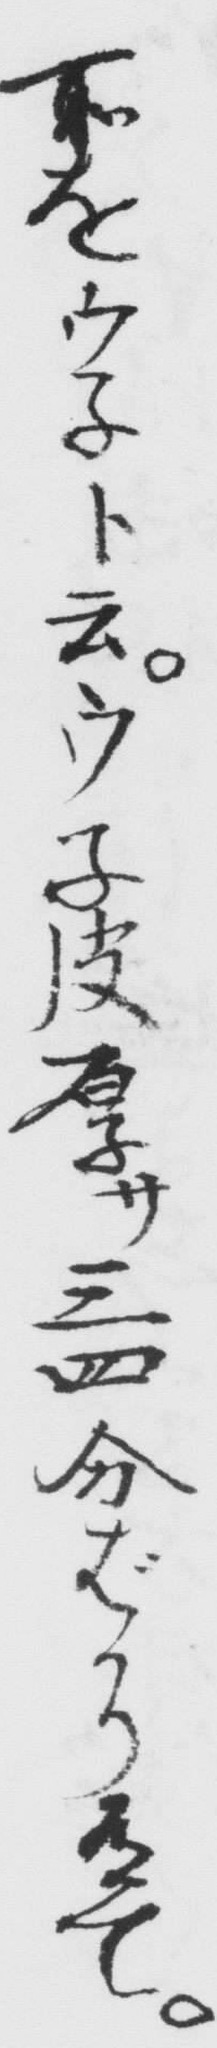下をウネト云。ウネ皮厚サ三四分ばかり有て。

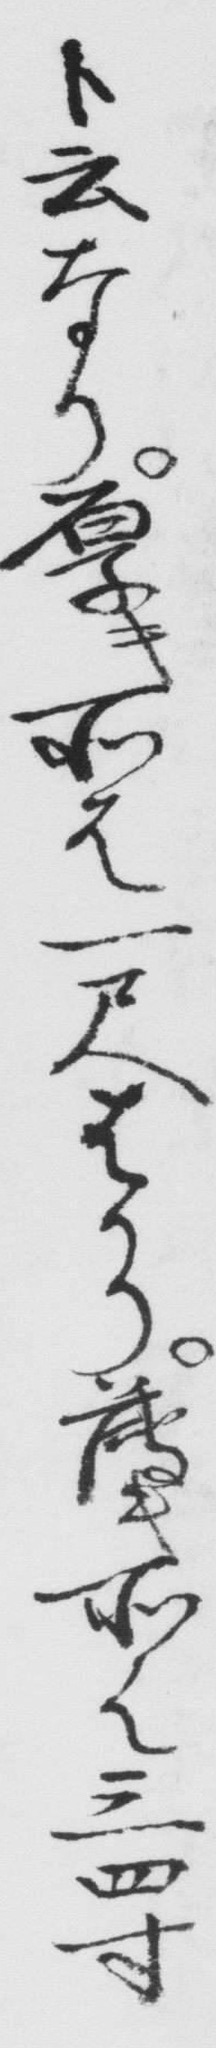ト云なり。厚キ所は一尺はかり。薄キ所は三四寸
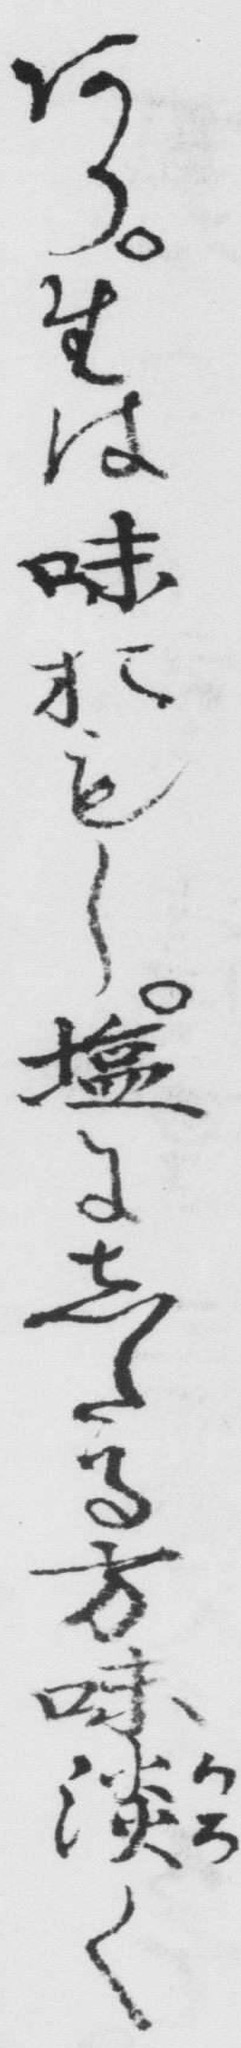あり。生は味おもし。塩にしたる方味淡く
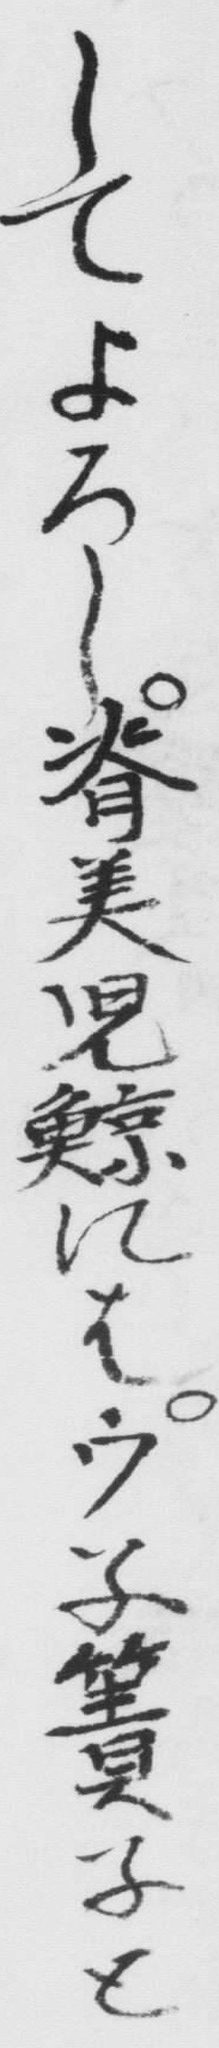してよろし。背美児鯨には。ウネ簀子と
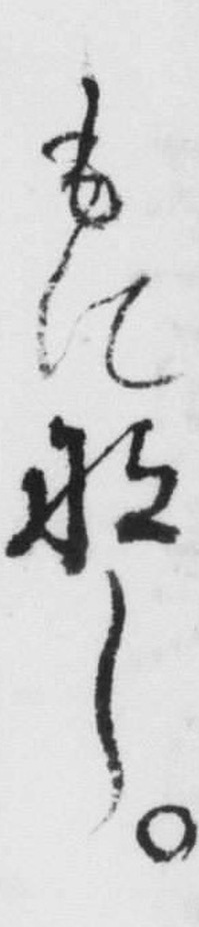もになし。
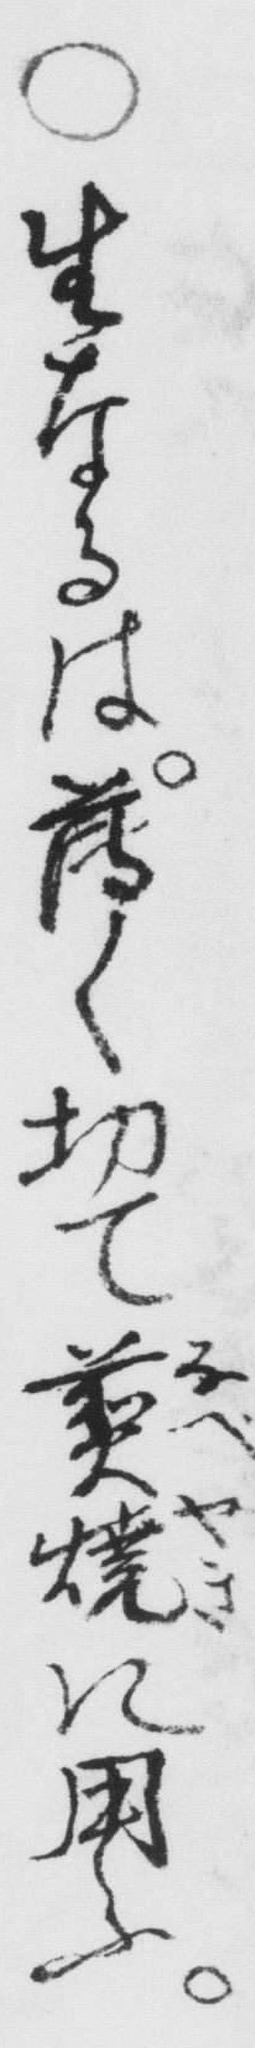○生なるは。薄く切て煎焼に用ふ。
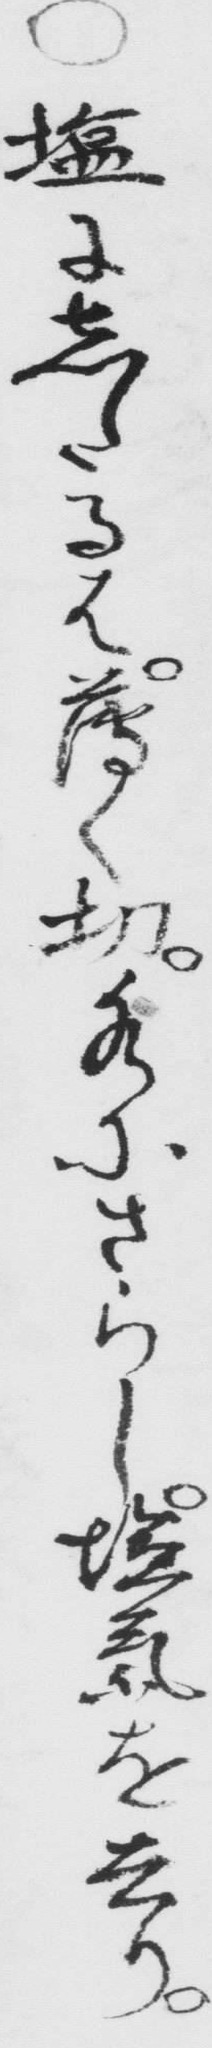○塩にしたるは。薄く切。水にさらし。塩気を去り。
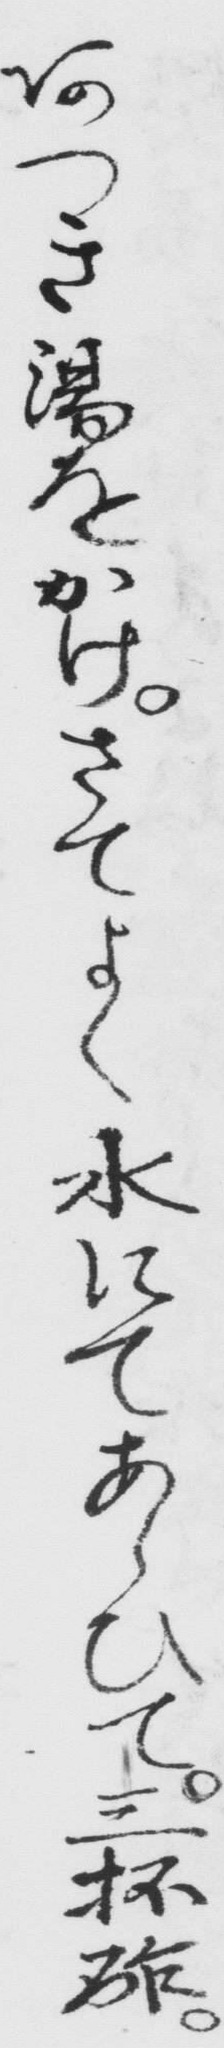あつき湯をかけ。さてよく水にてあらひて。三杯酢。
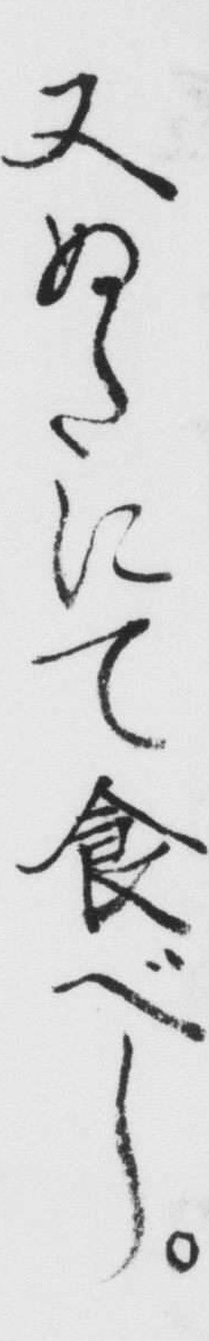又ぬたにて食べし。
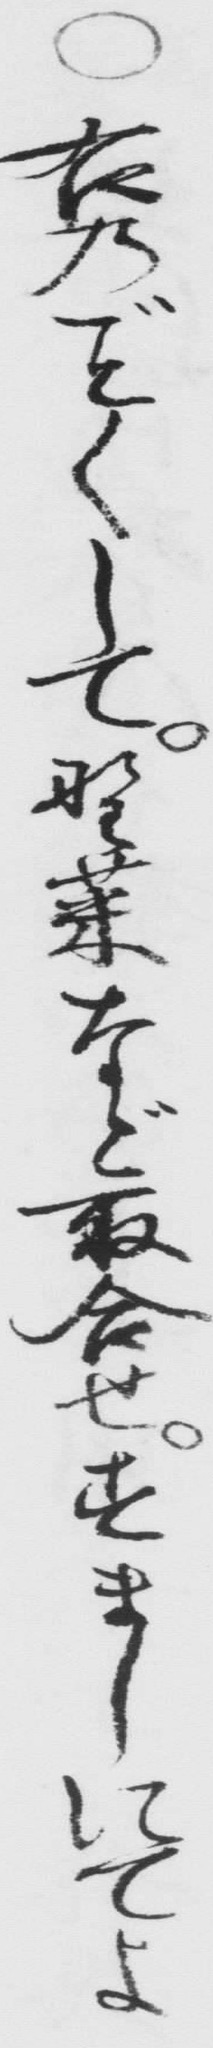○右のごとくして。野菜など取合せ。すましにてよ
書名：鯨肉調味方
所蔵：大阪府立大学学術情報センター 国文学研究資料館
